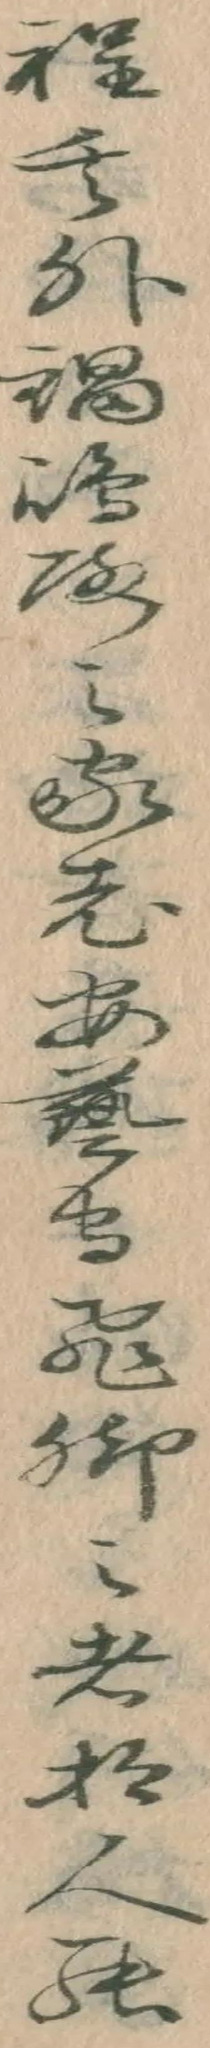程其外鍋島殿之家老安芸守飛脚之者拾人罷
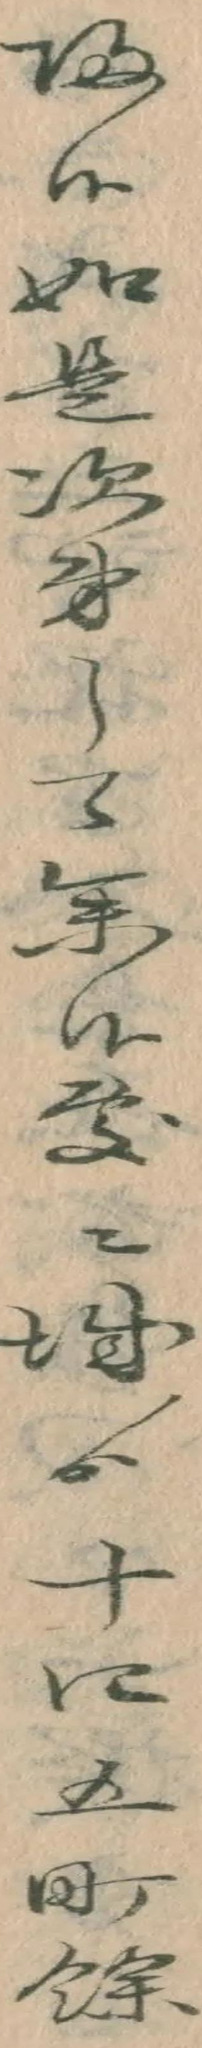帰候如是次第して参候処に城ゟ十四五町余
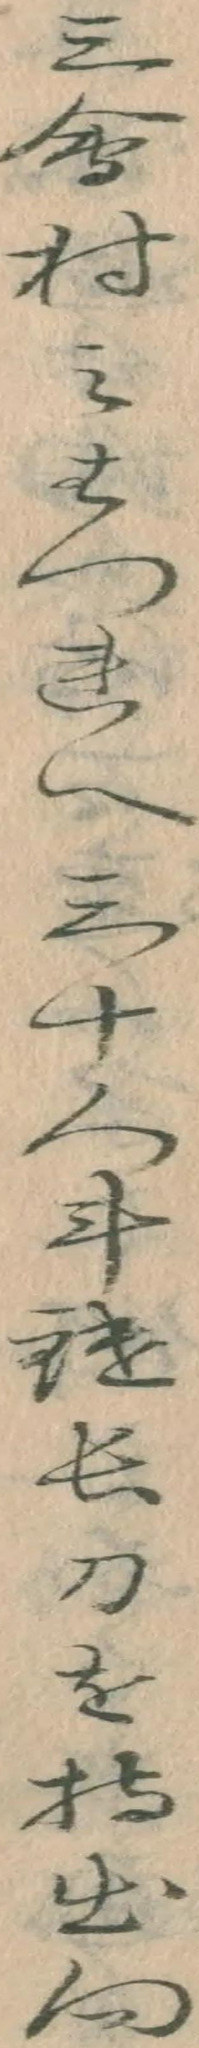三会村之者つ連へ三十人斗鑓長刀を持出向
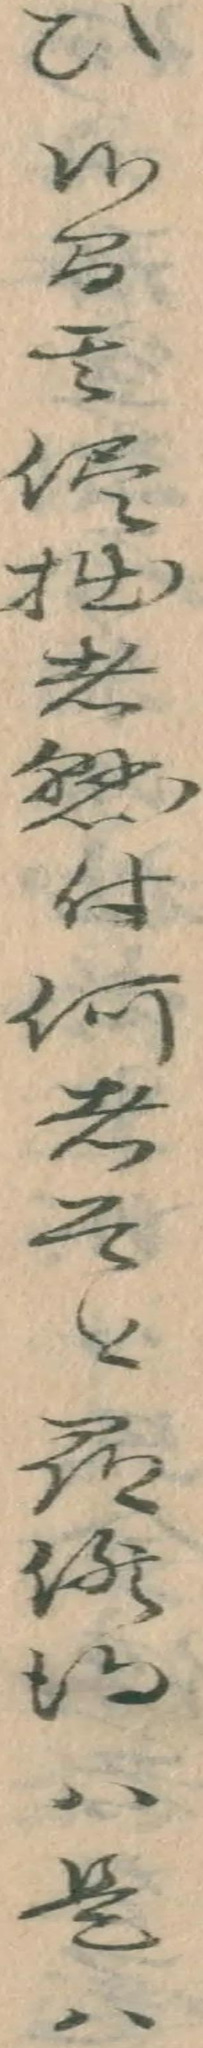ひ候間其侭拙者懸付何者そと尋候得は是は
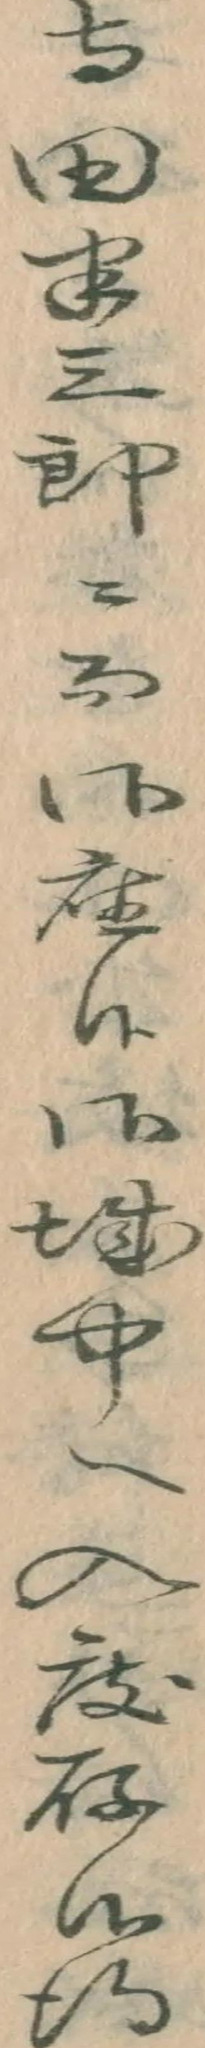寺田半三郎に而御座候御城中へ入度存候得

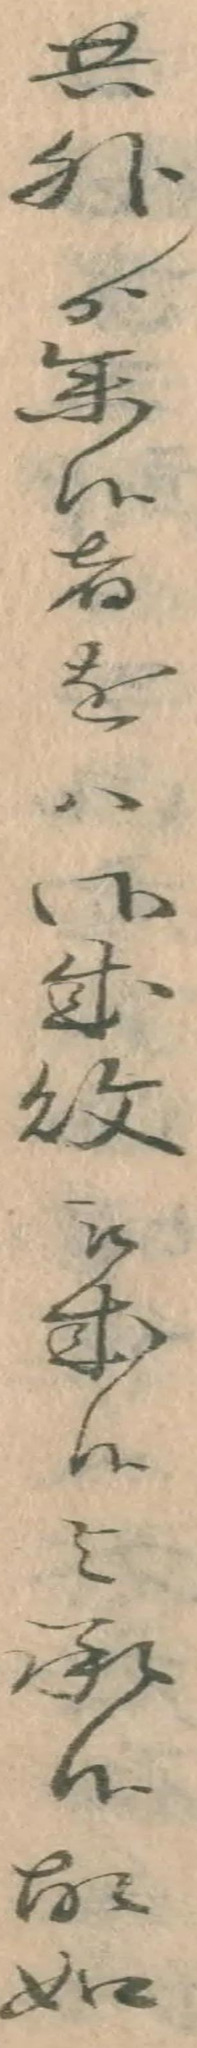其外ゟ参候者をは御成敗被成候与承候故如
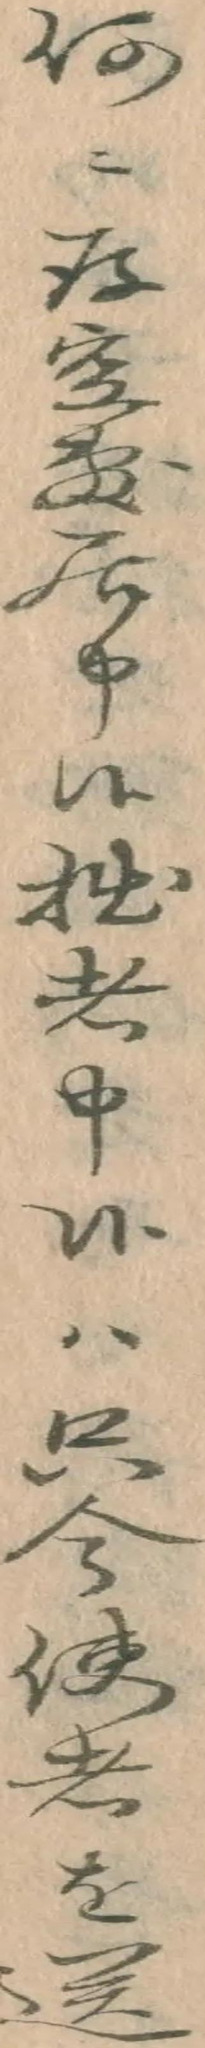何に存空敷居申候拙者申候は只今使者を送
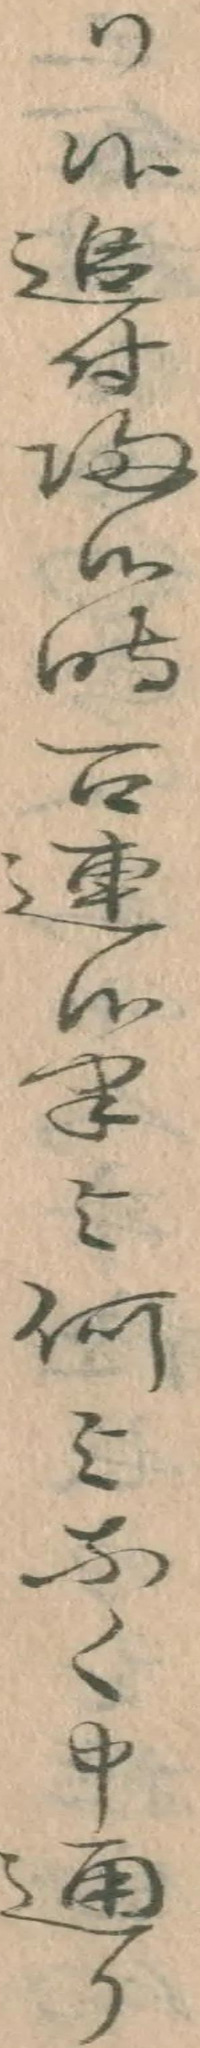り候追付帰候時召連候半与何与なく申通り
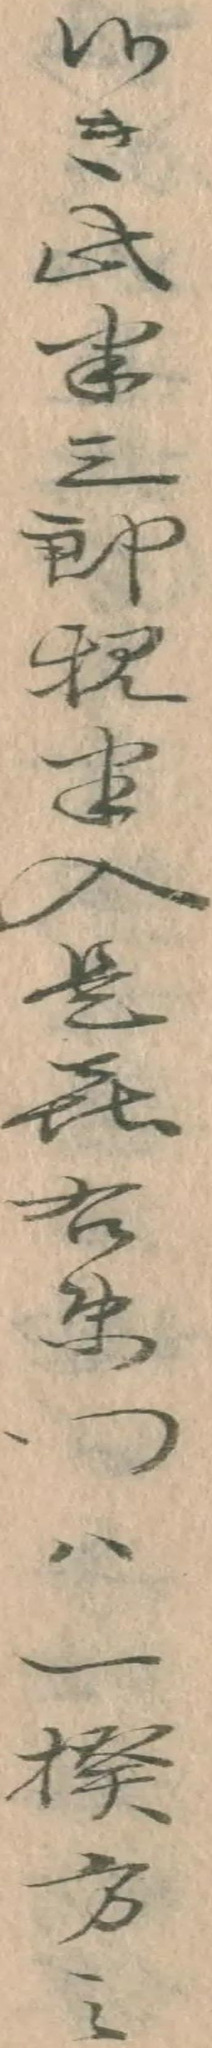候き此半三郎親半入是喜右衛門は一揆方之
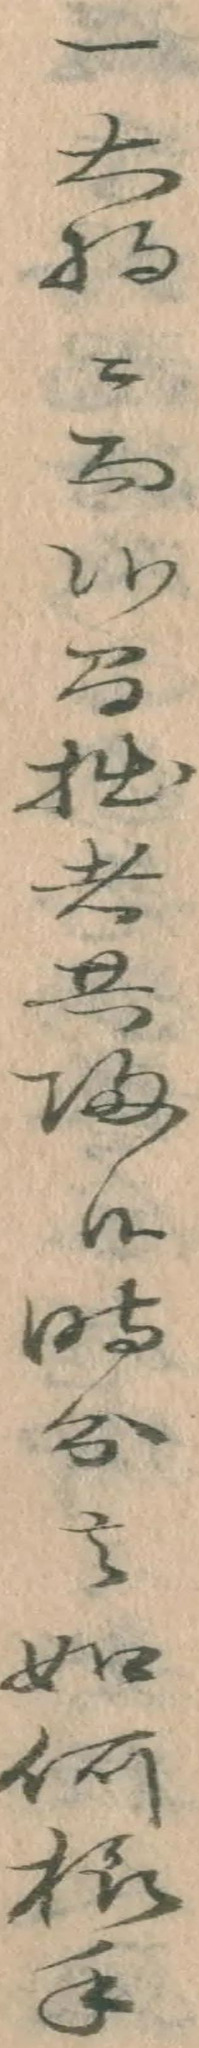一大将に而候間拙者共帰候時分者如何様手
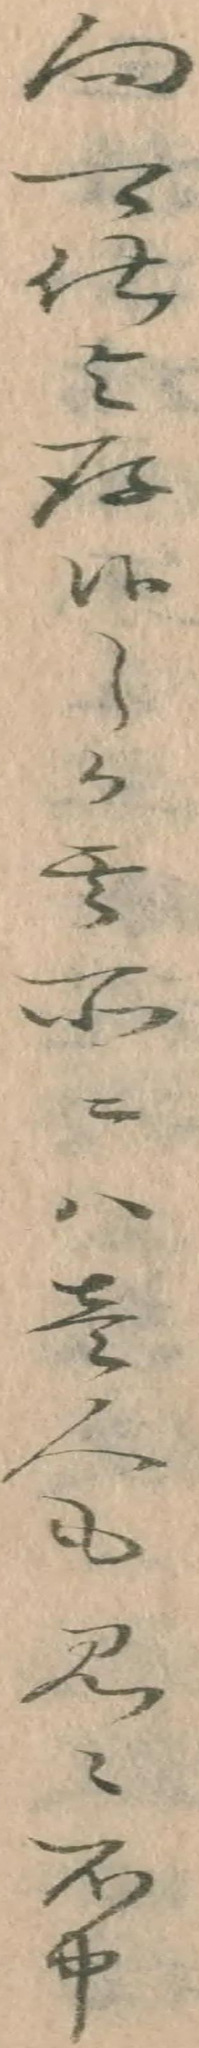向可仕と存候しか其所には壱人も見に不申
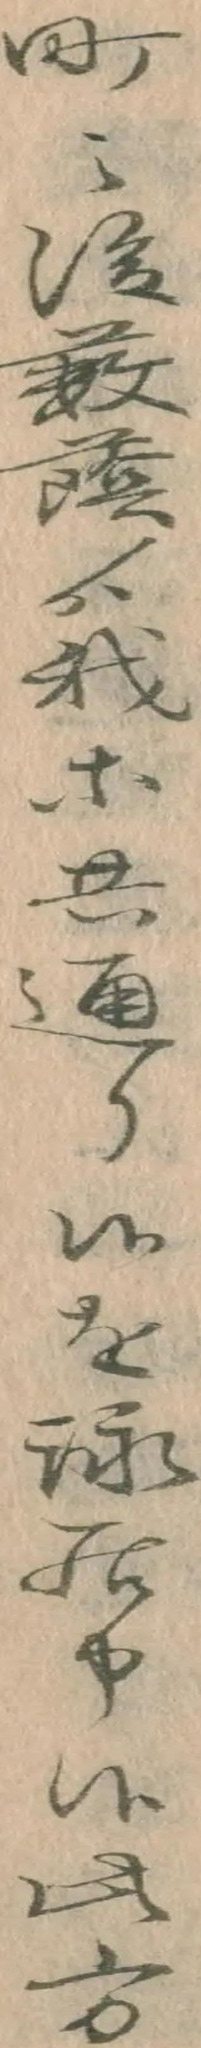町之後藪蔭ゟ我等共通り候を詠居申候此方
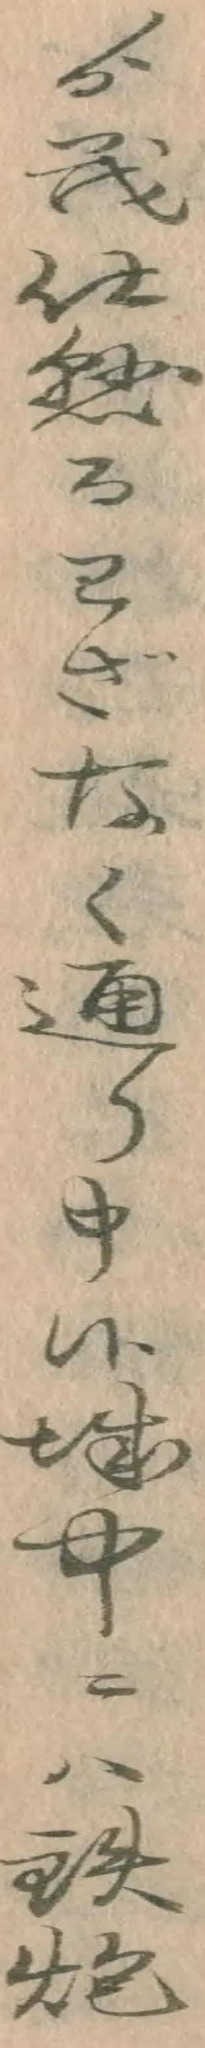ゟ茂仕懸る已ざなく通り申候城中には鉄炮
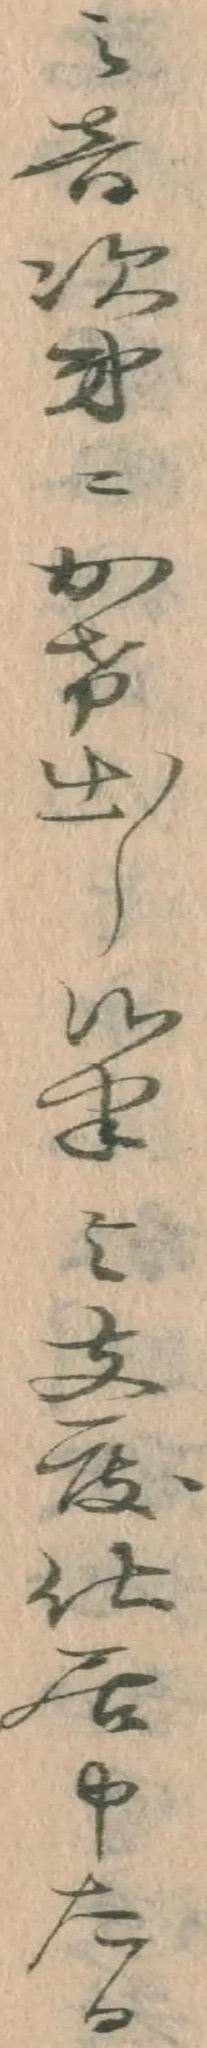之音次第にか希出し候半与支度仕居申たる
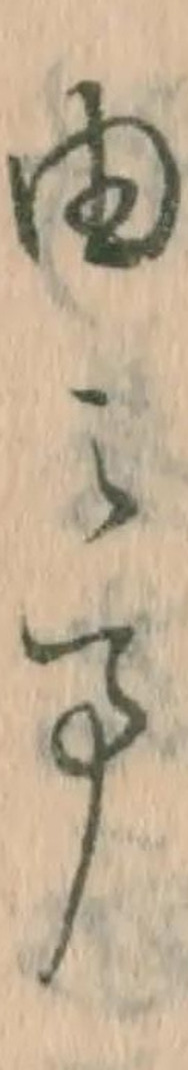由之事
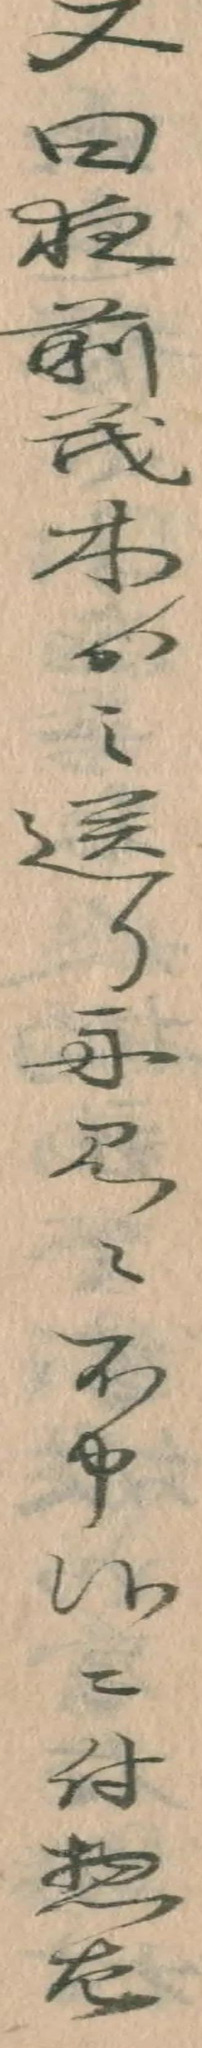又曰夜前茂木ゟ之送り舟見に不申候に付惣左
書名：切支丹御退治記 49巻. [2]
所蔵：国立国会図書館 National Diet Library, JAPAN
